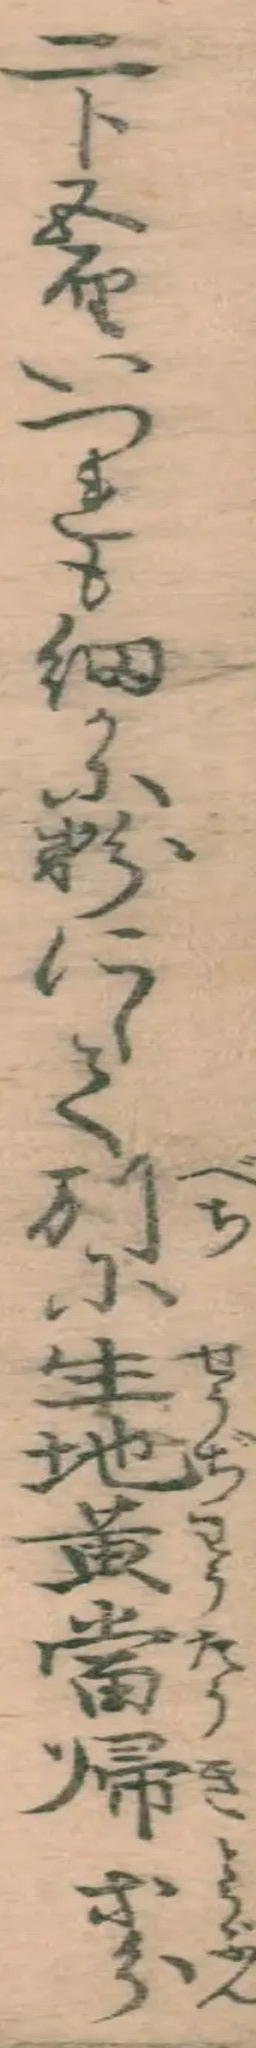二分五厘いつれも細かに粉にして別に生地黄当帰等分
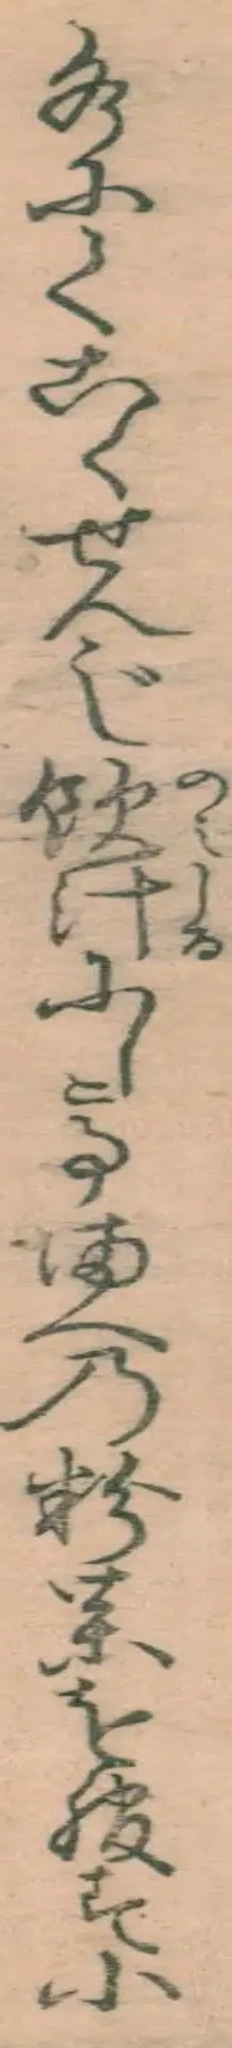水にてこくせんじ飲汁にしてまへの粉薬を服す小
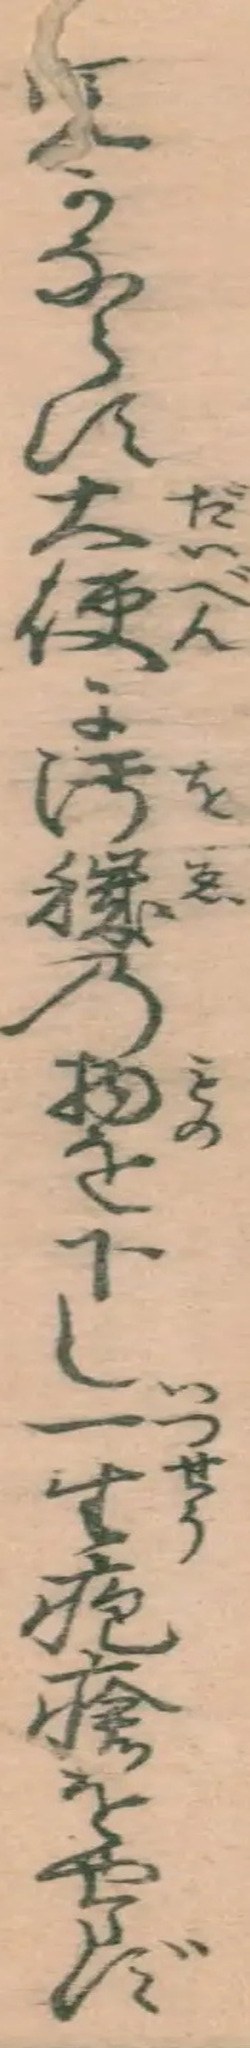児かならす大便に汚穢の物を下し一生疱瘡をやまず
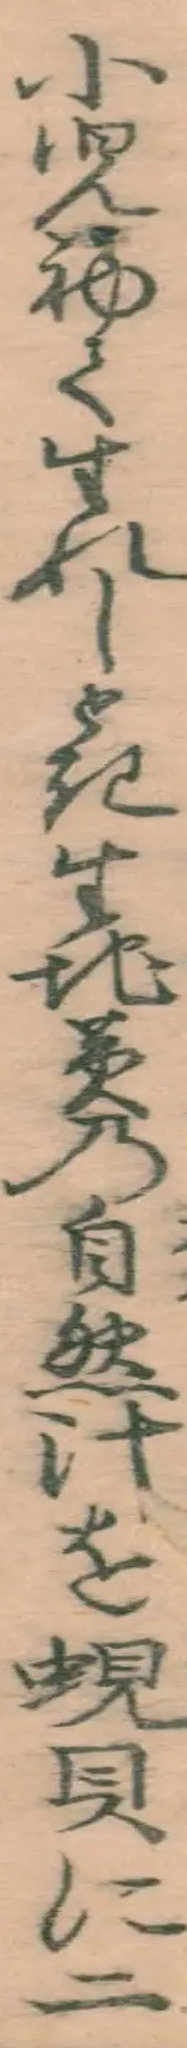小児初て生れしとき生地黄の自然汁を蜆貝に二
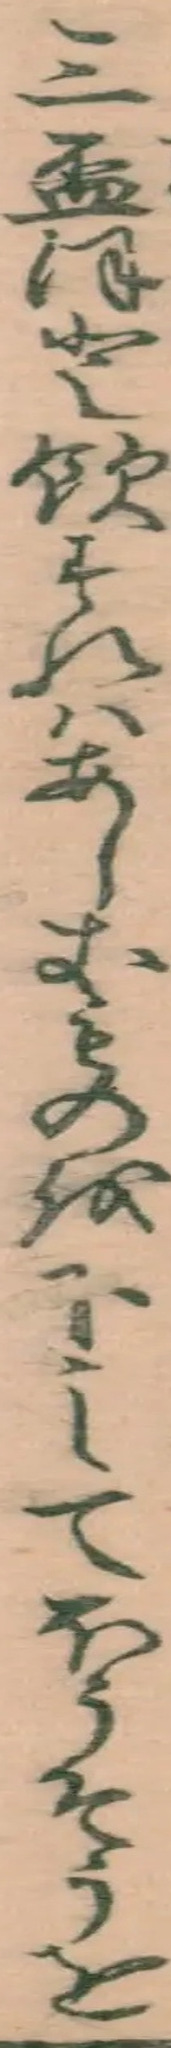三盃ほど飲すれはあしきものを下してほうそうを
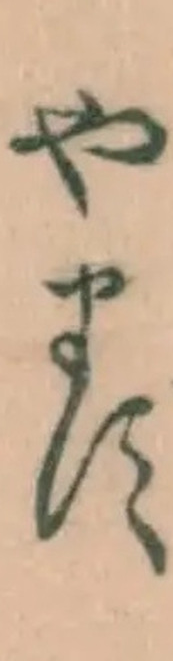やまず
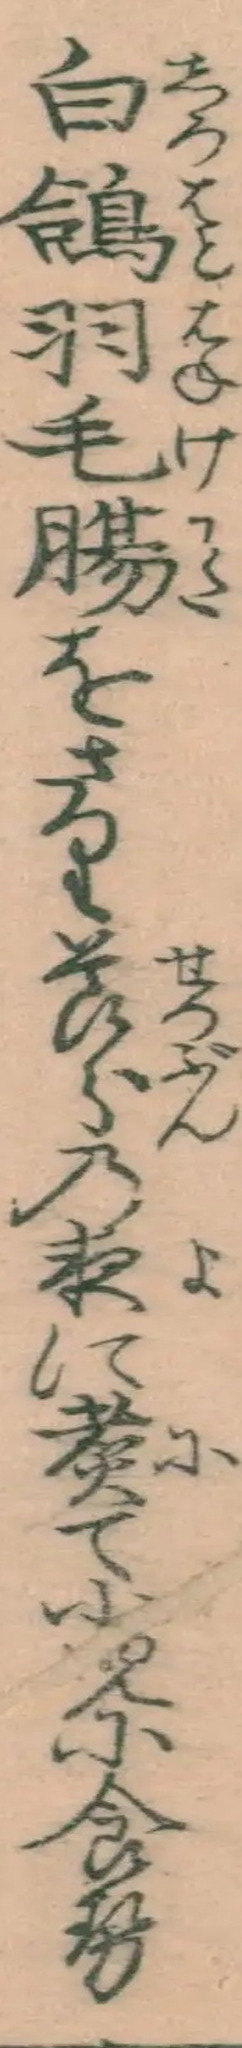白鴿羽毛膓をさり節分の夜に煮て小児に食せ
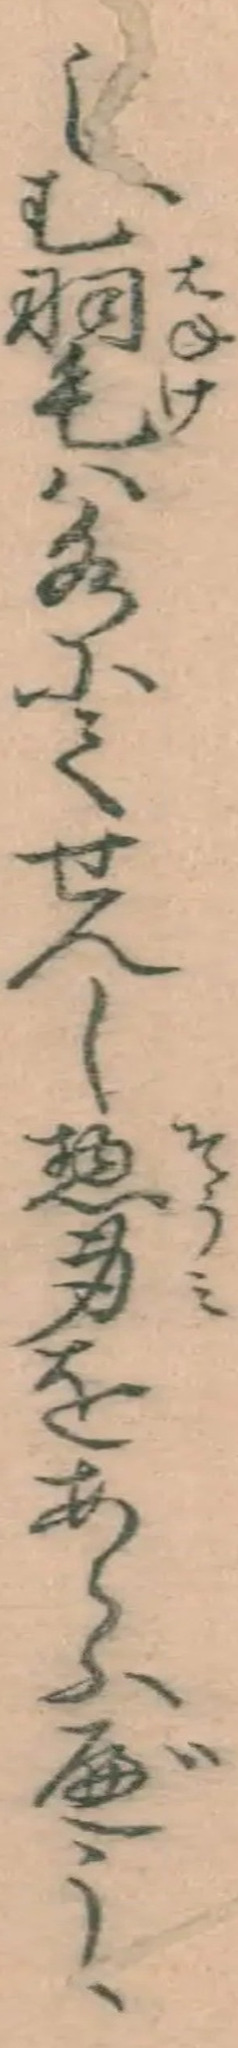しむ羽毛は水にてせんし惣身をあらふべし
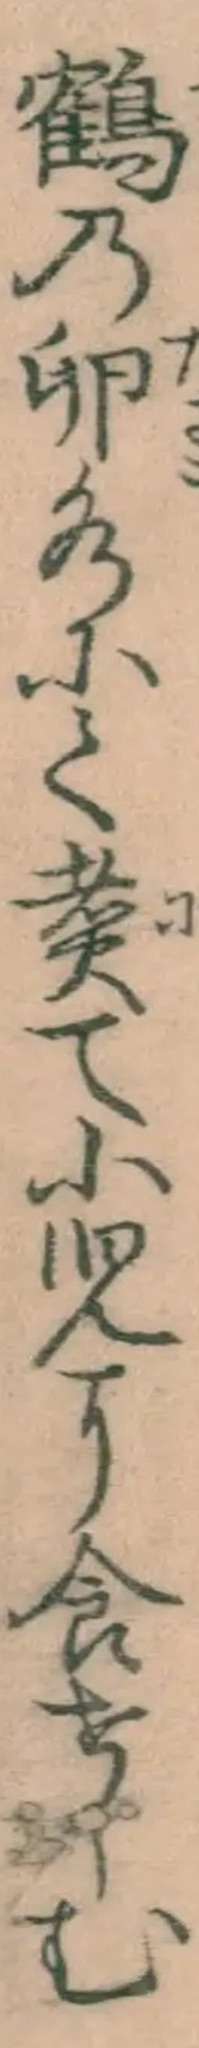鶴の卵水にて煮て小児に食せしむ

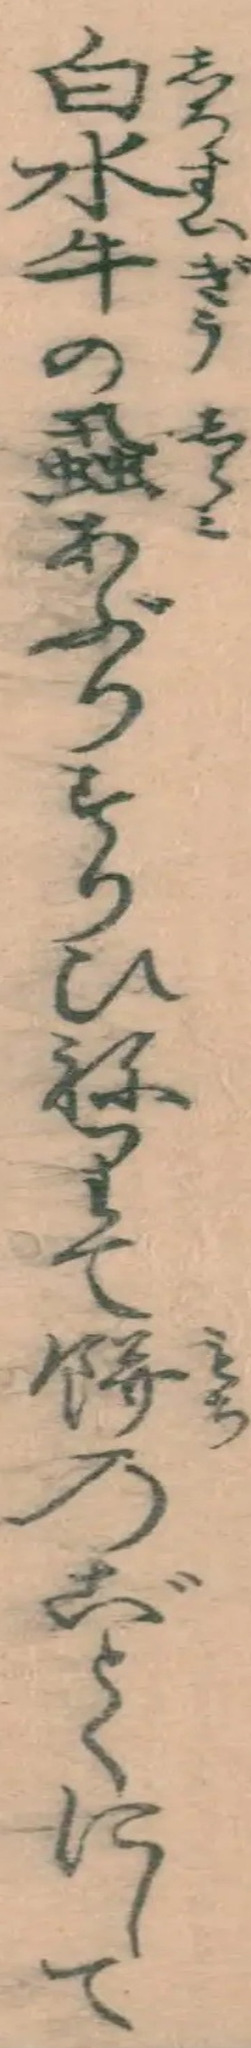白水牛の蝨あぶりすりひねりて餅のごとくにして
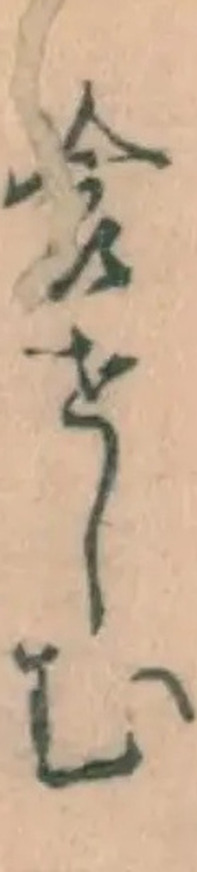食せしむ
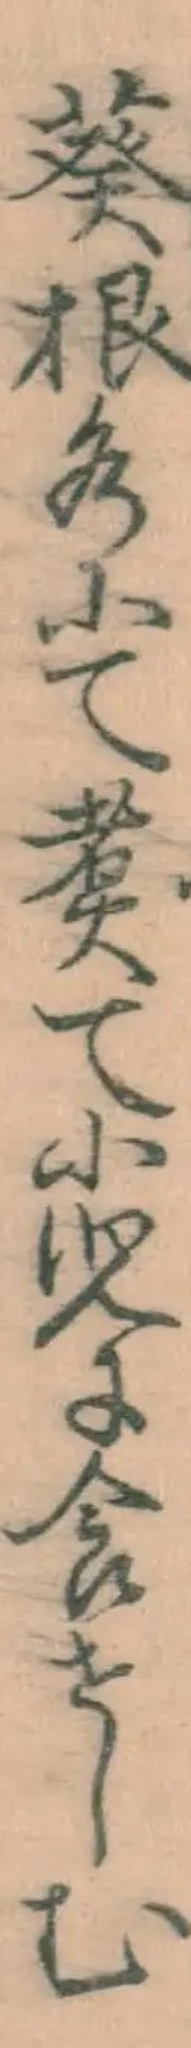葵根水に煮て小児に食せしむ
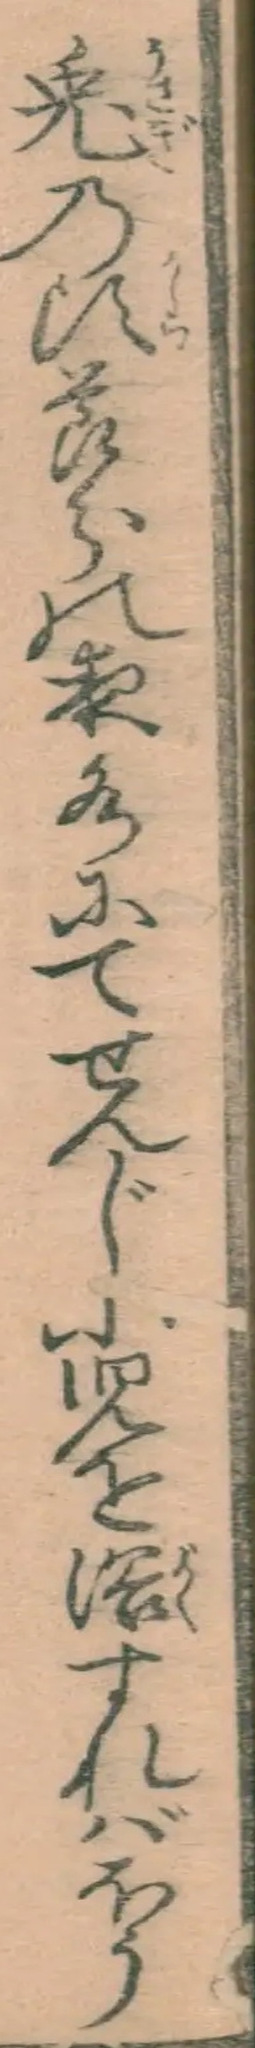兎の頭節分の夜水にてせんじ小児を浴すればほう
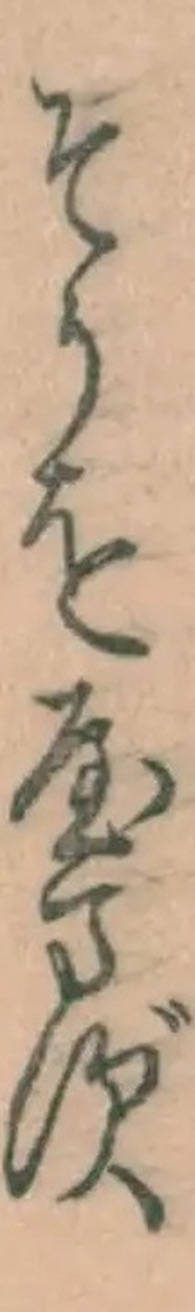そうをやまず
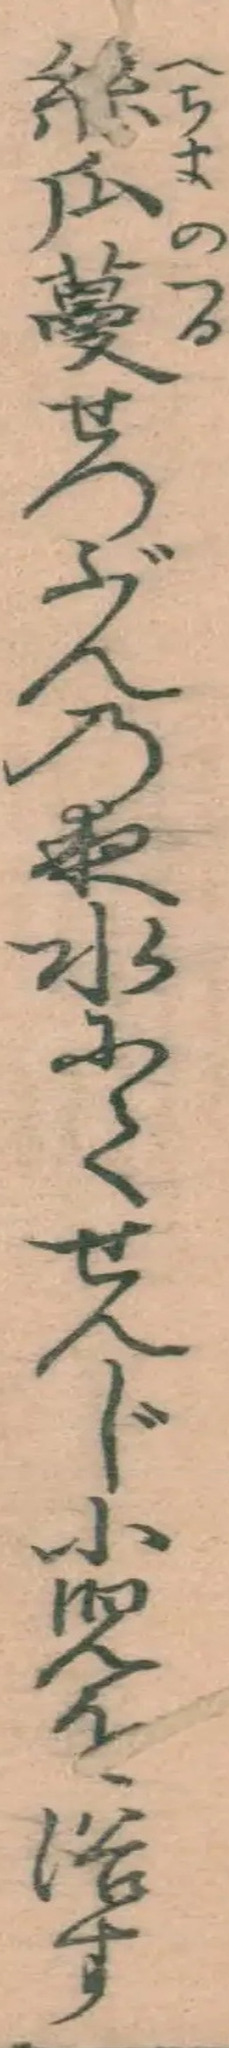糸瓜蔓せつぶんの夜水にてせんじ小児を浴す
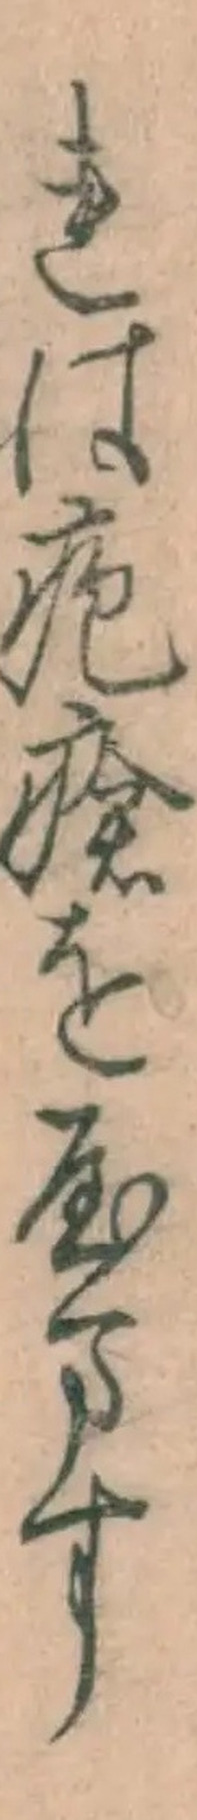れは疱瘡をやます
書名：雨夜談
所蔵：国立国会図書館 National Diet Library, JAPAN
